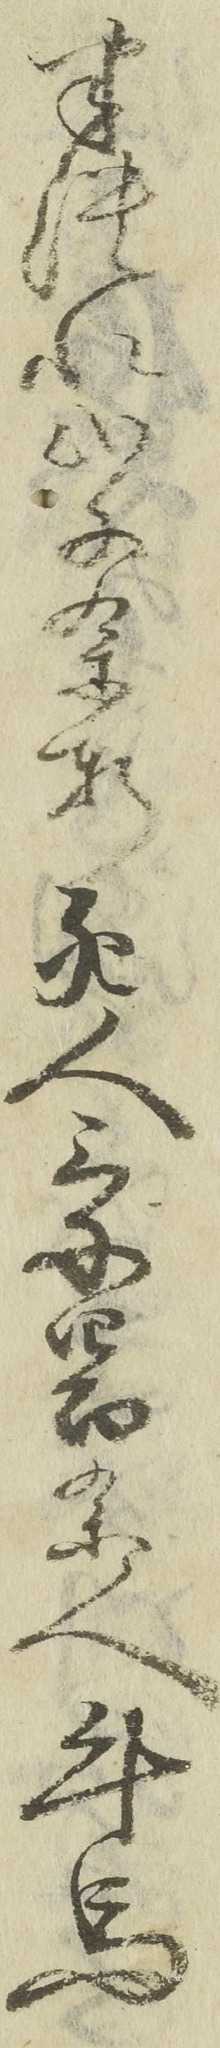半潰れ弐千余軒死人三千四百余人牛馬
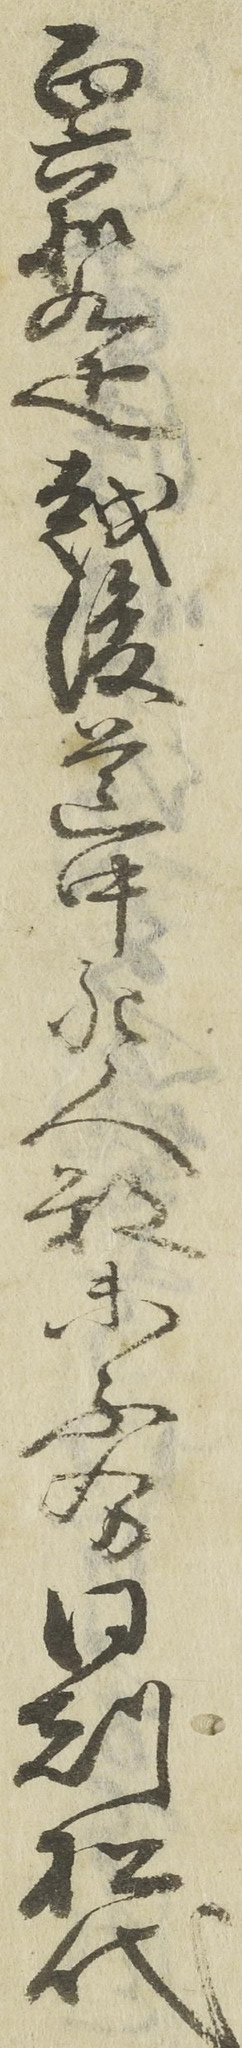百六拾九疋越後道中死人数未不分同刻松代
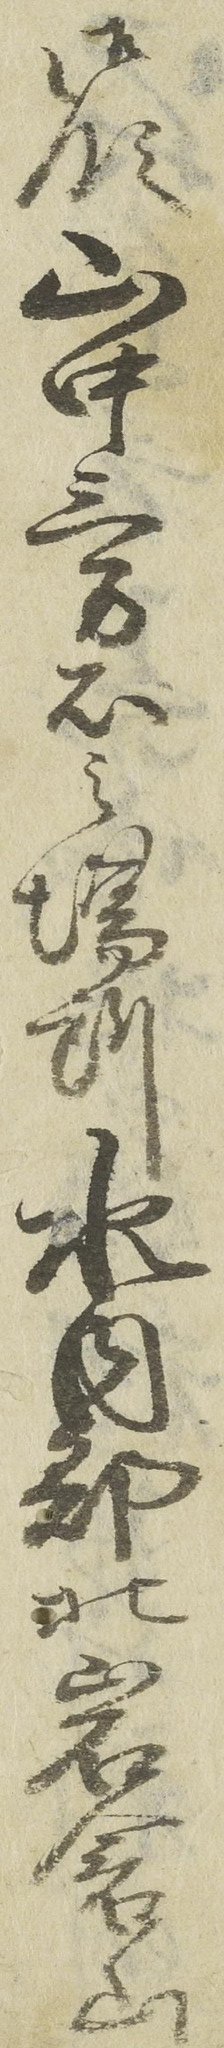御領山中三万石之場所水内郡北岩倉山
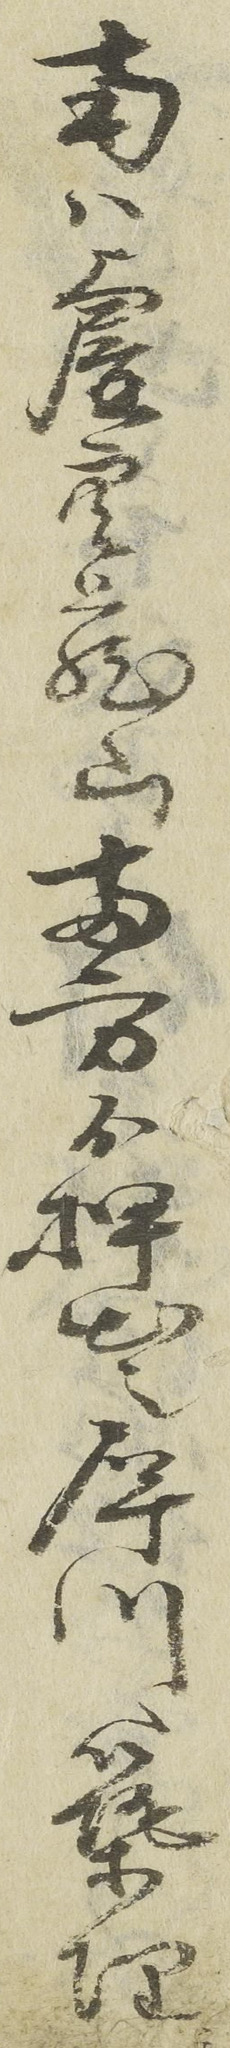南ハ虚空蔵山南方ゟ押出之犀川へ築埋ミ
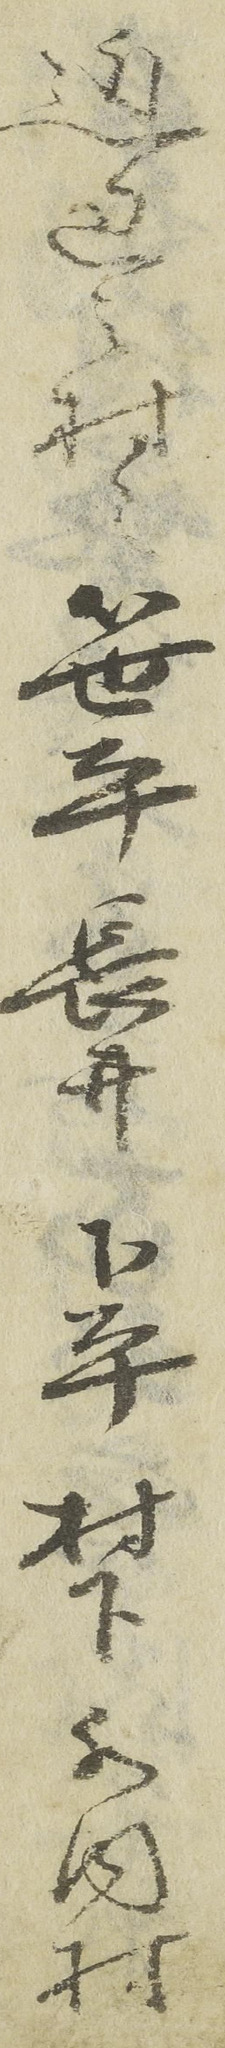近辺之村々笹平長井下平村下水内村

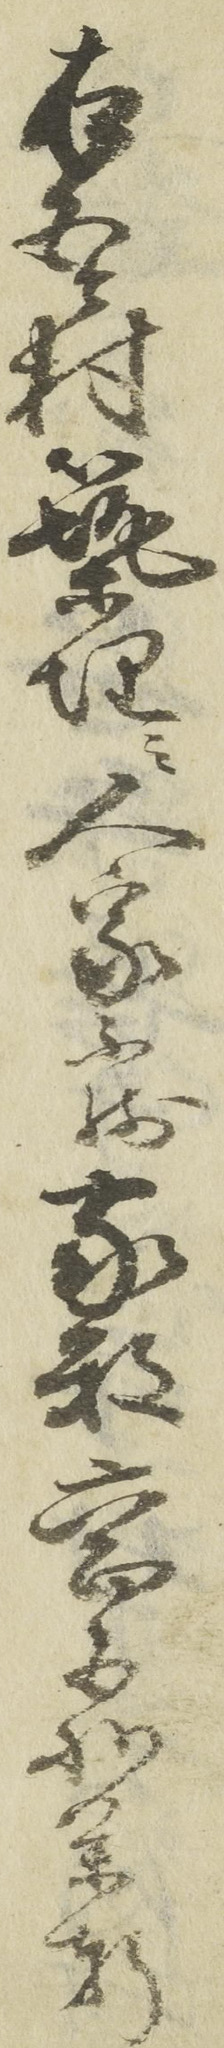右五ヶ村築埋ミ人家不残家数六百五拾余軒
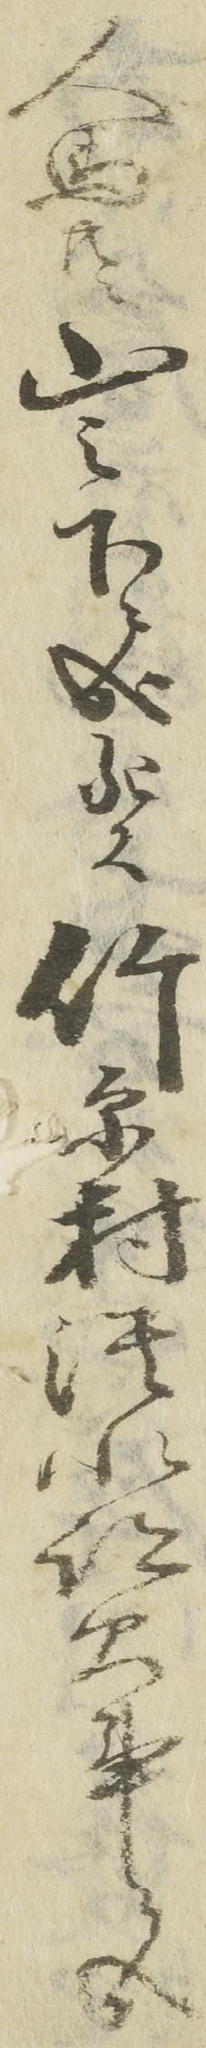人馬共ニ山之下ニ成死ス竹原村潰れ跡火事ニ成
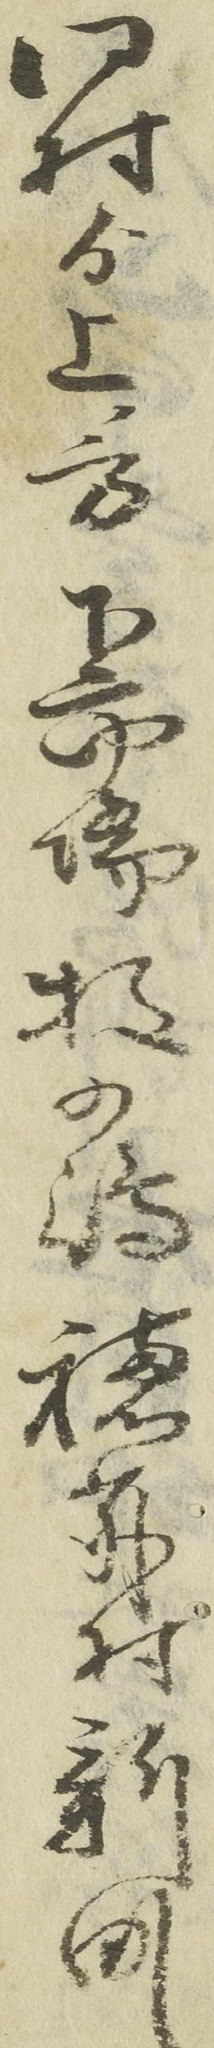同村ゟ上ノ方下市場牧の嶋穂刈村新町
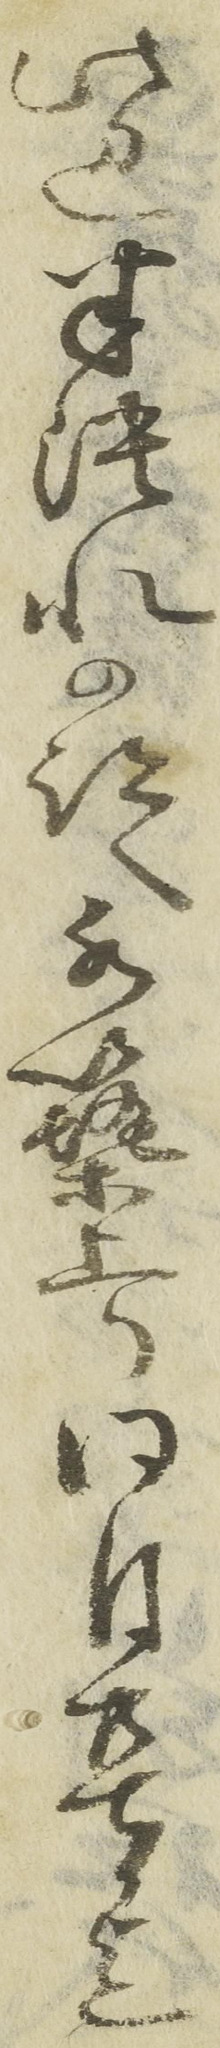此辺半潰れの跡へ水築上り同月廿七日迄
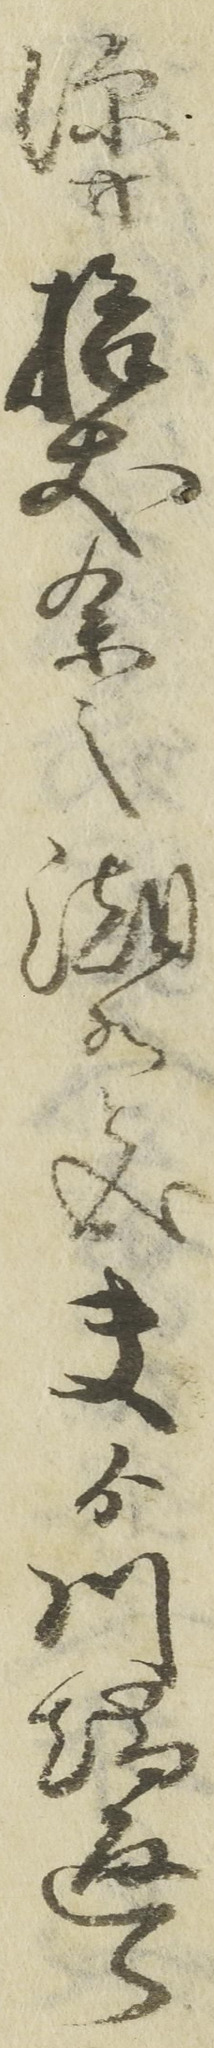深サ拾丈余之湖水と成夫ゟ川端通り
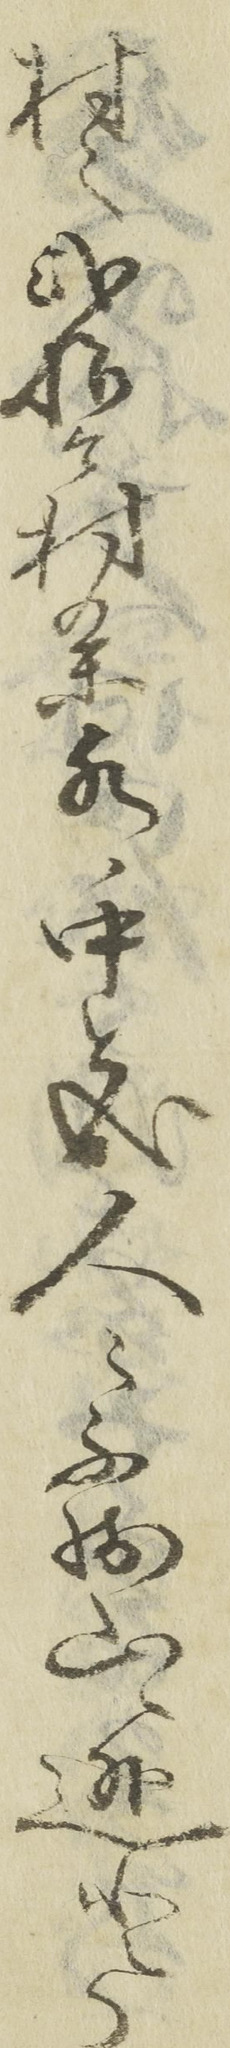村々弐拾ヶ村余水ノ中と成人々不残山へ逃登り
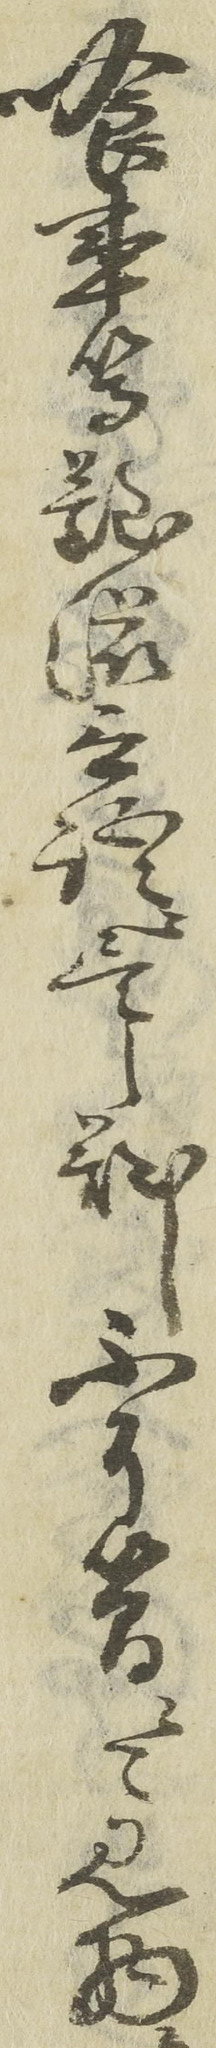喰事等難渋言語ニ尽し難し不了簡ニて見物ニ
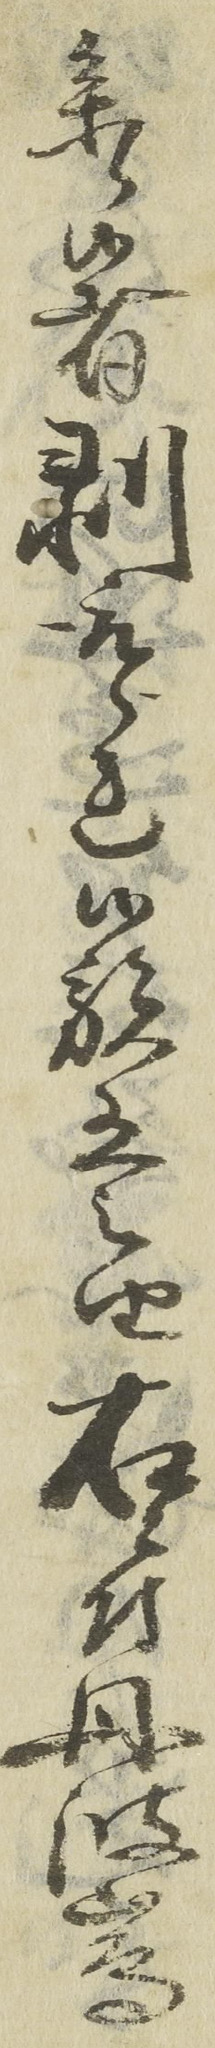参り候者剥取られ候族有之由右ニ付丹波嶋
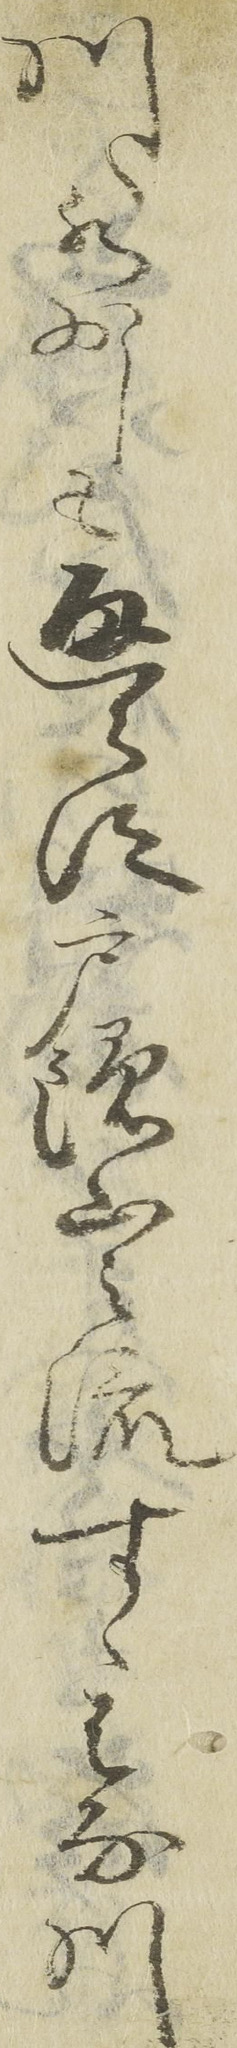川へ水少しも通らす戸隠山之流すへはな川
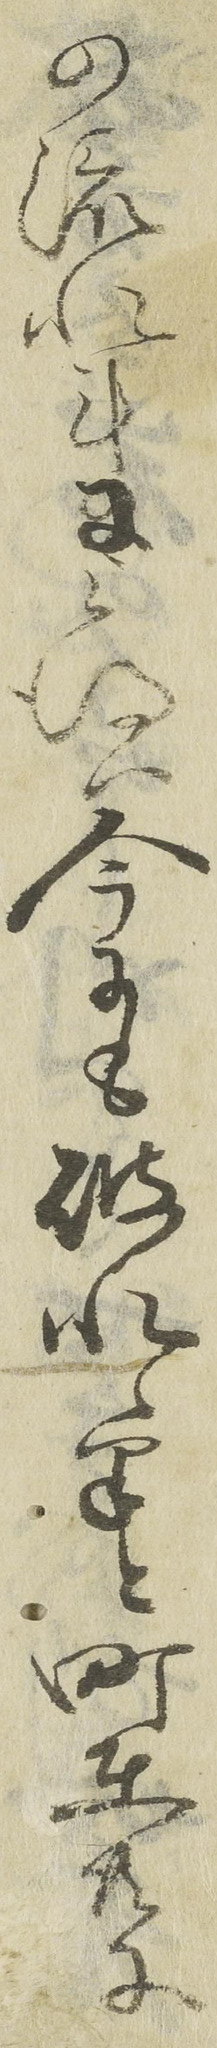の流れ斗に候得ハ今にも破れ候半と町在共に
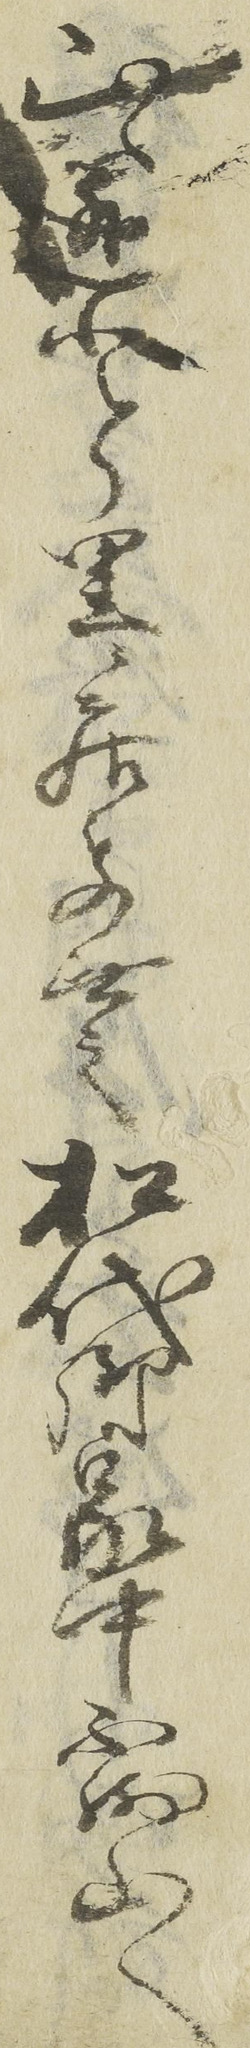山へ逃登り里ニ居もの無之松代御家中不残山へ
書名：弘化四　大地震由来　全
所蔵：東京大学地震研究所図書室 Earthquake Research Institute Library, The University of Tokyo, JAPAN
